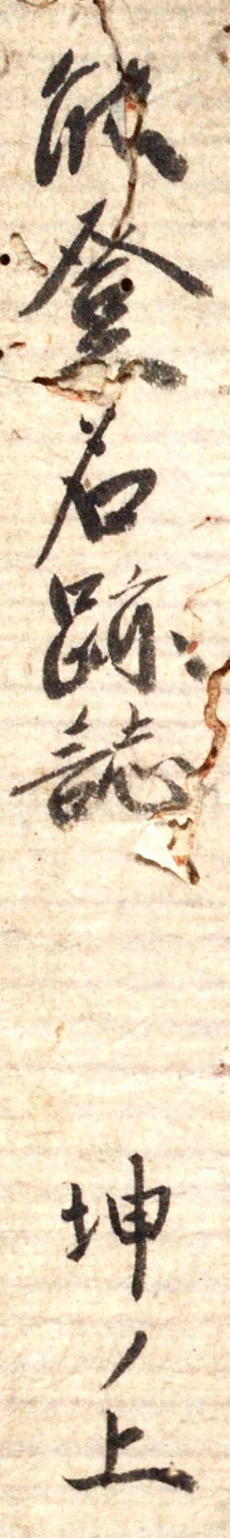能登名跡誌坤ノ上

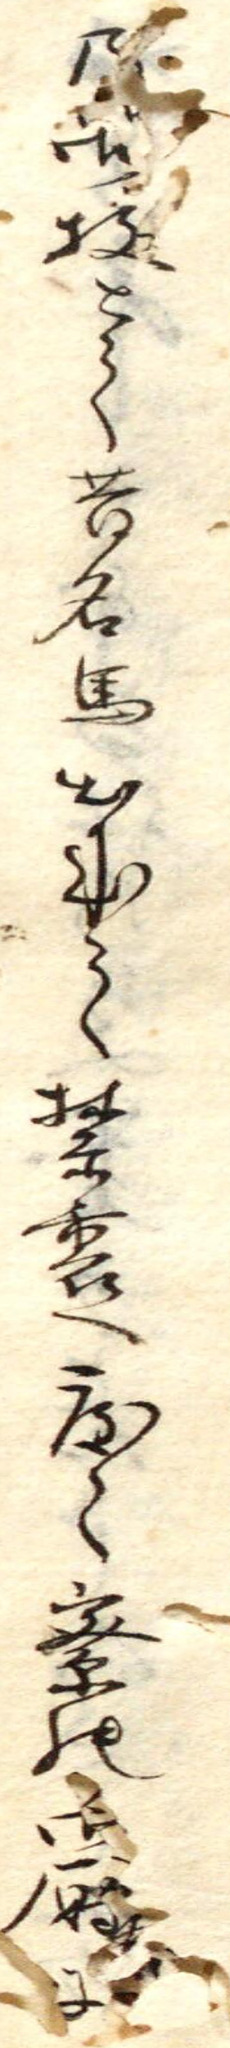の御牧とて昔名馬出来て禁裏へ度々寮の御厨に
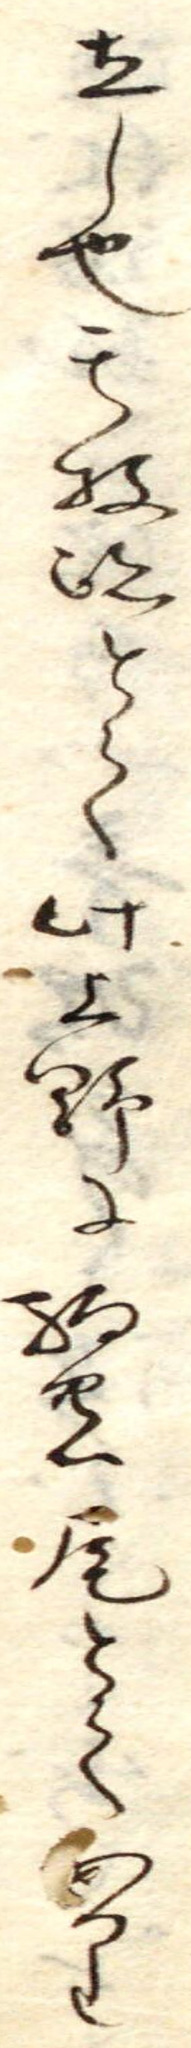立し也其牧跡とて此上野に駒の尾とてあり
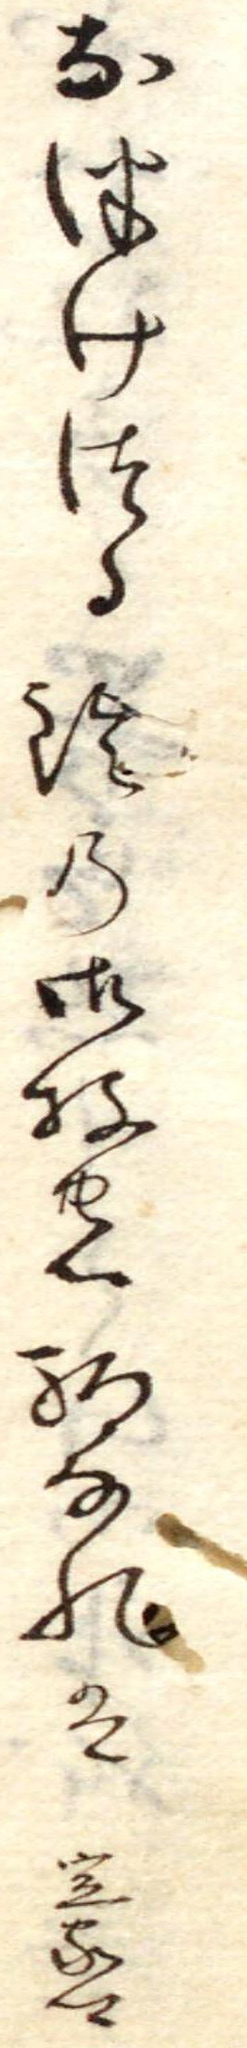なつけつる鈴の御牧の駒なれは定家卿
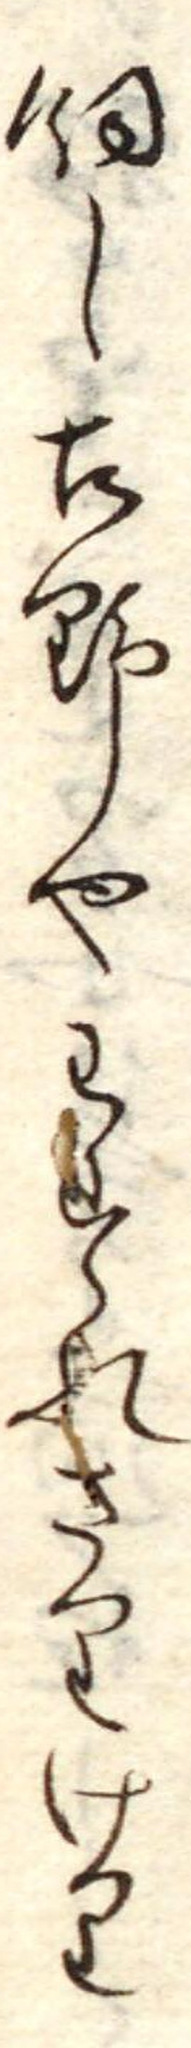飼し古野やわすれさりけり
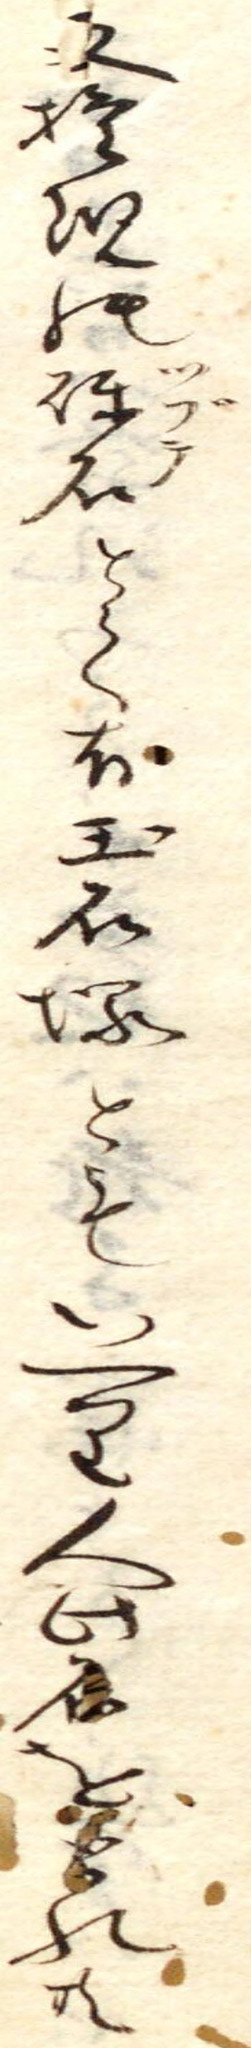又権現の礫石とて有玉石塚ともいへり人此石をとれ共
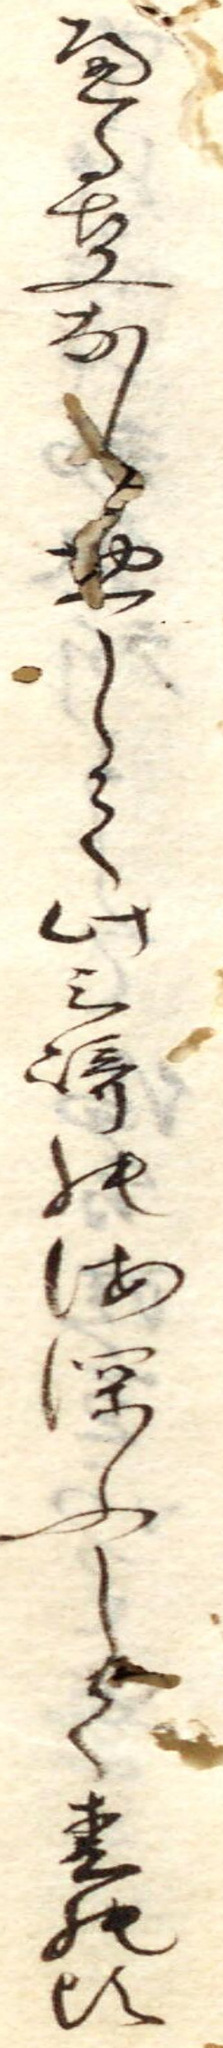へる事なし惣して此三崎の海深ふして春の頃
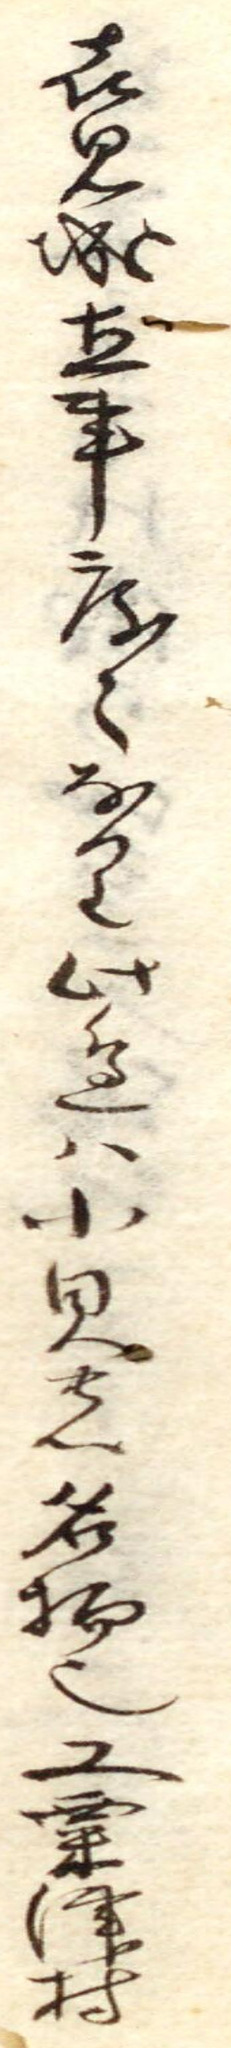喜見城立事度々なり此辺は小見の名物也又粟津村
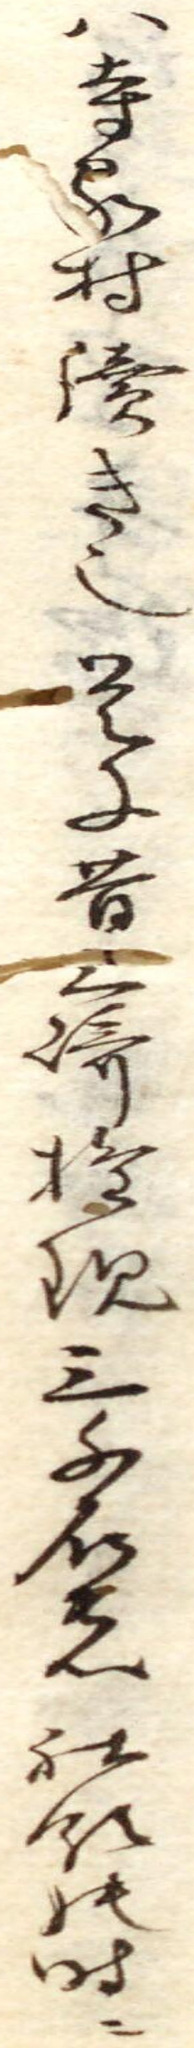は寺家村続き也是に昔三崎権現三千石の社領の時に
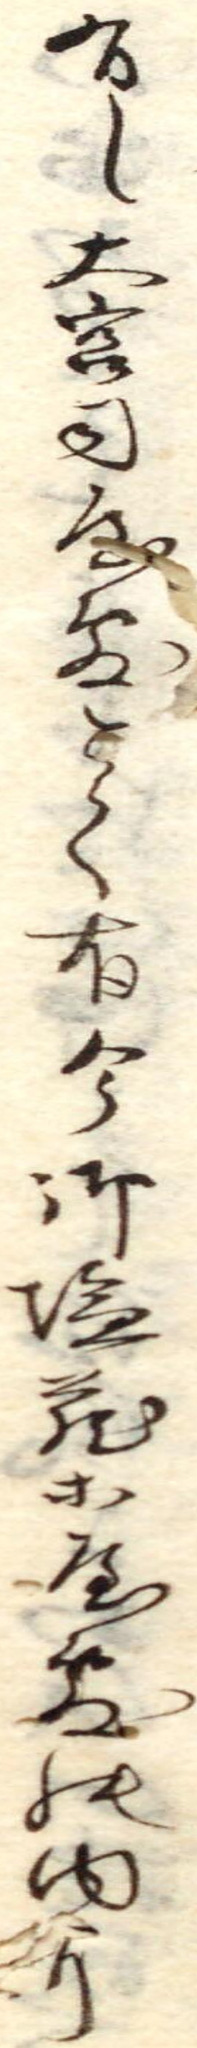有し大宮司屋敷とて有今御塩蔵等屋敷の内に
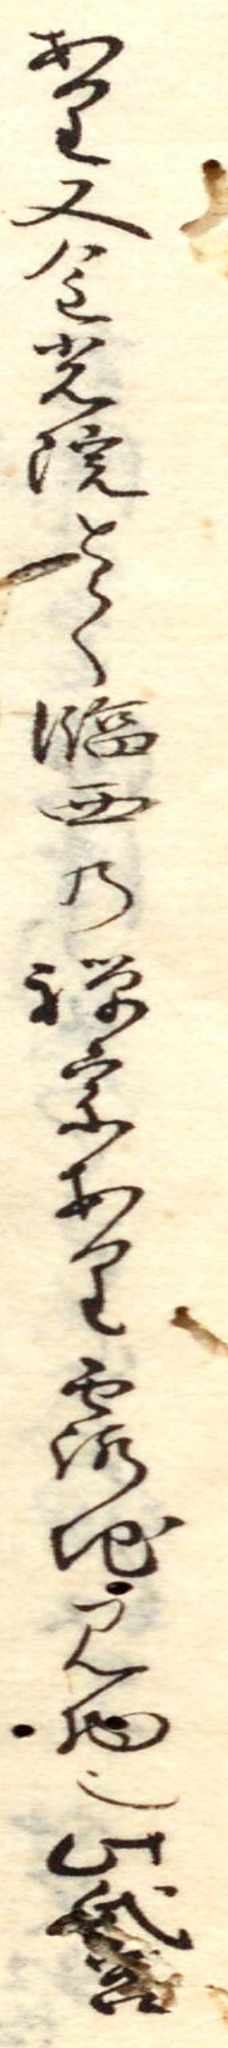あり又金光院とて臨西の禅宗あり露地見物也此氏宮
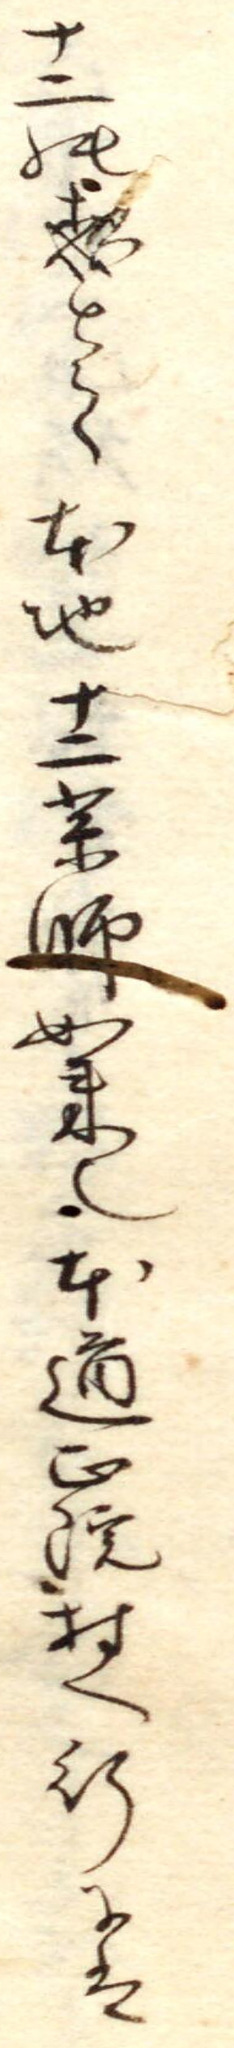十二の森とて本地十二薬師如来也本道正院村へ行には
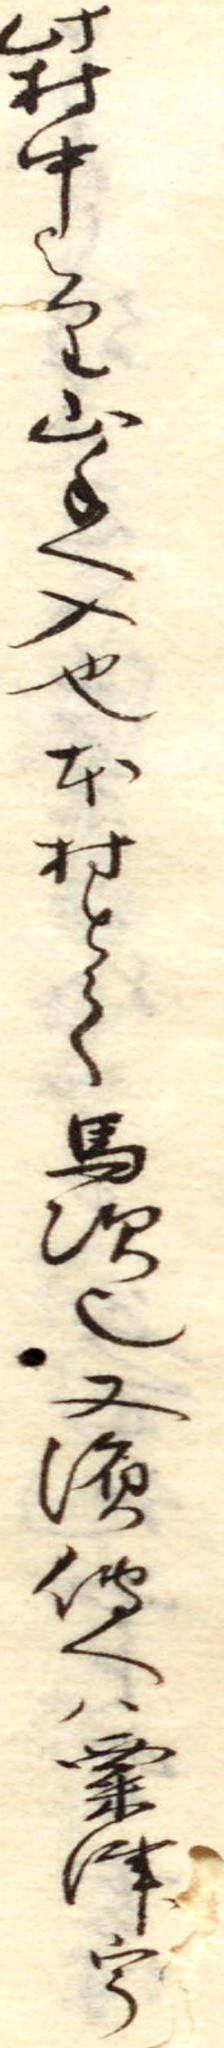此村中より山手へ入也本村とて馬次也又浜伝へは粟津宇
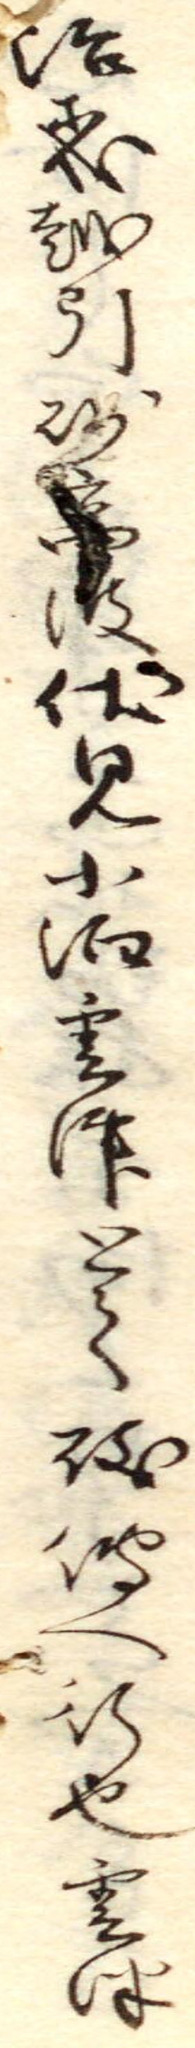治森越引砂高波伏見小泊雲津とて磯伝へ行張也雲津
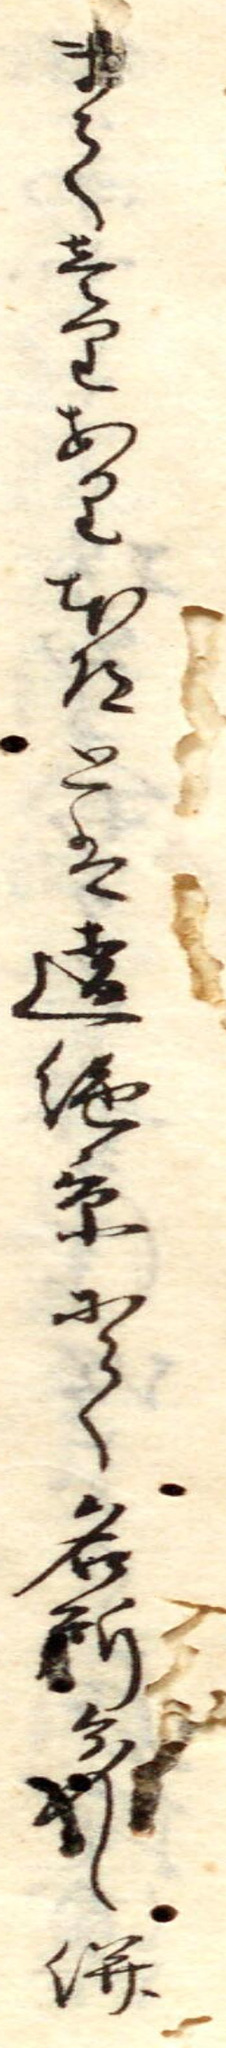まて壱里あり本道とは違絶景にて名所多し併
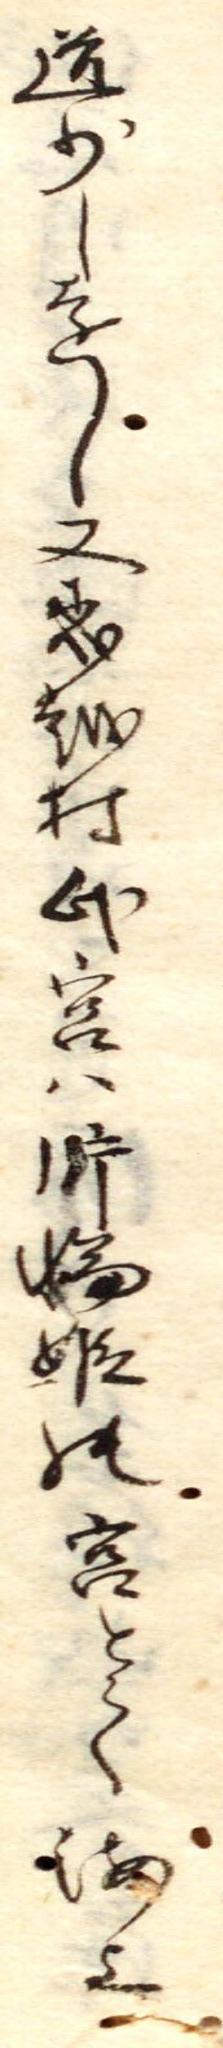道少し遠し又森越村氏宮は片輪姫の宮とて海上
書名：能登名跡誌
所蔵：Ishikawa Prefectural Library
